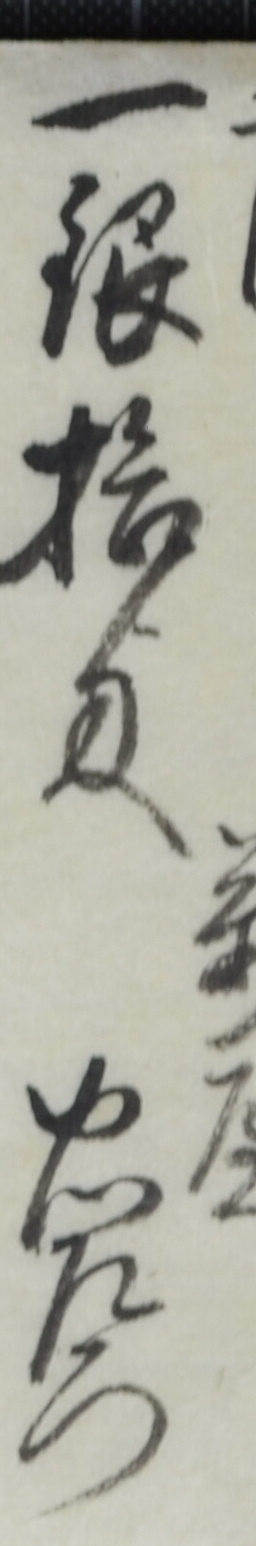一銀拾匁忠左衛門
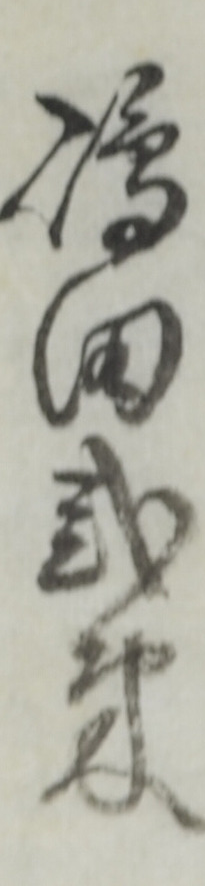嶋田弐朱
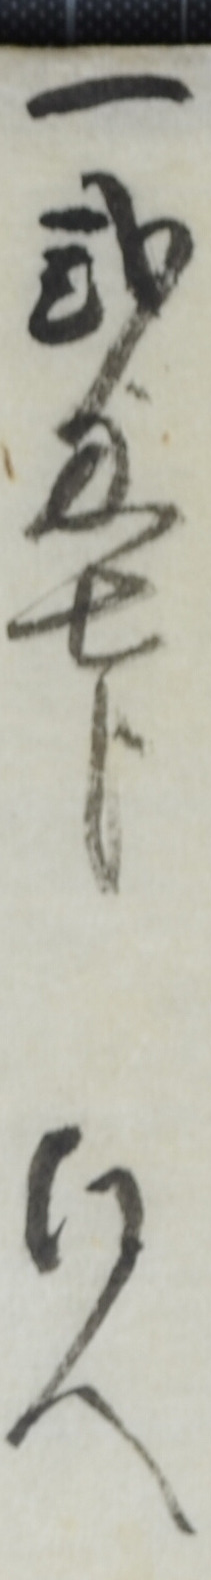一弐匁七分同人
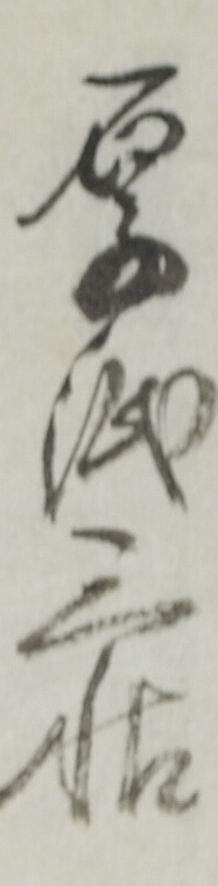厚紙三帖
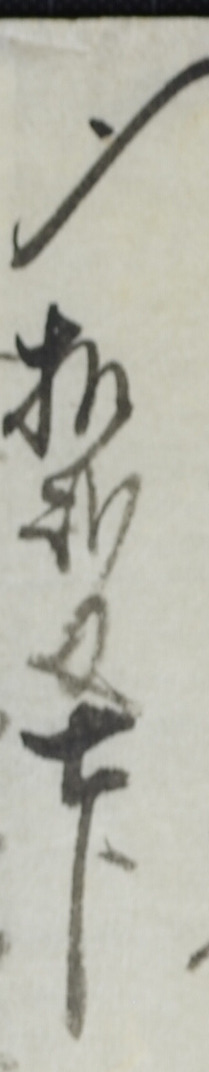〆拾弐匁七分
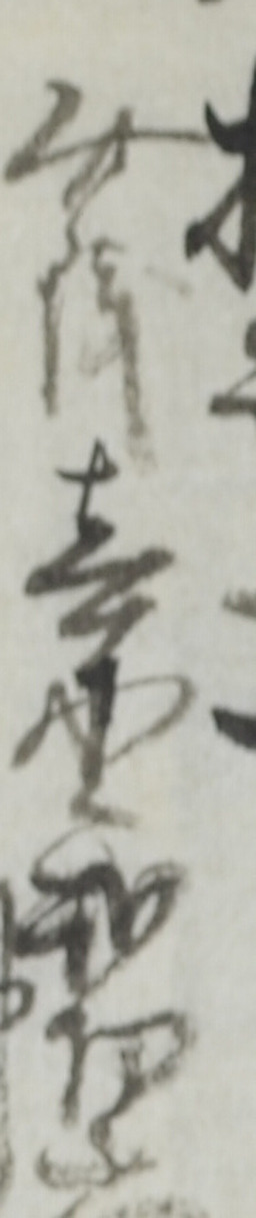此銭壱貫弐百六文
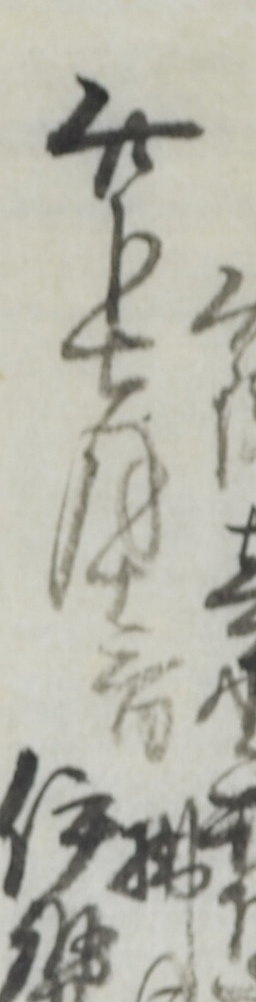此分七月十三日払済
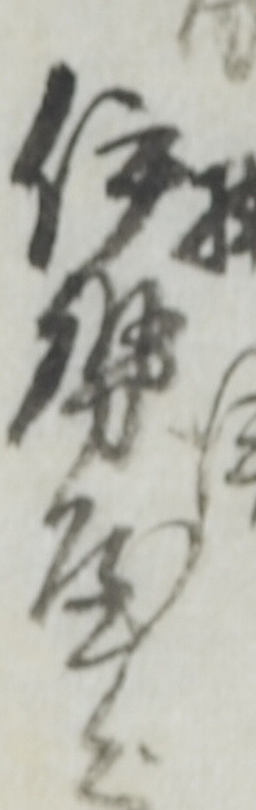伊勢屋分
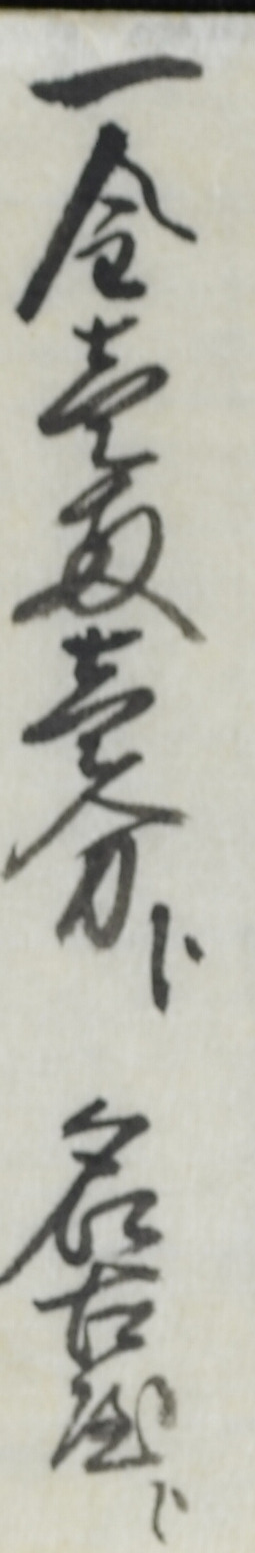一金壱両壱分ト名古屋江
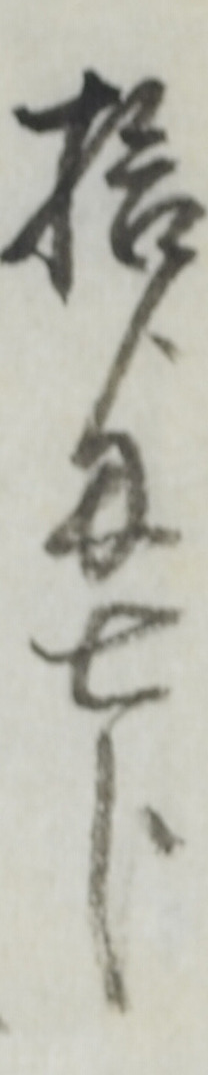拾匁七分
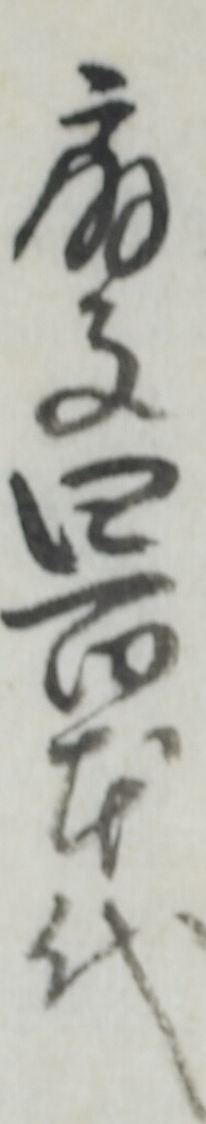扇子四百本代
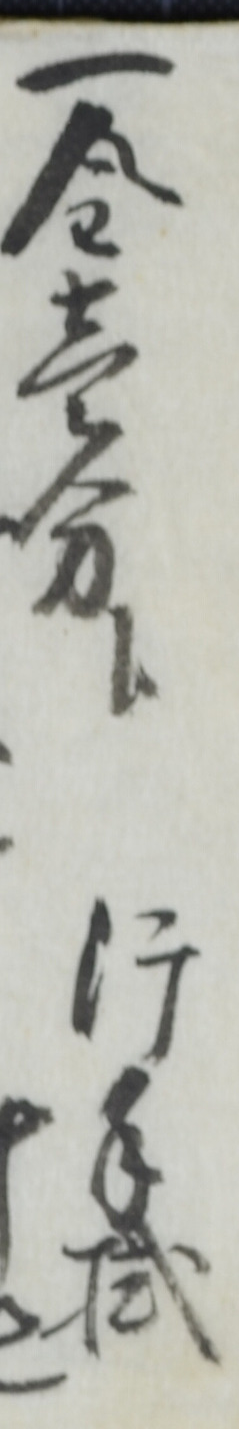一金壱分ト汗手拭
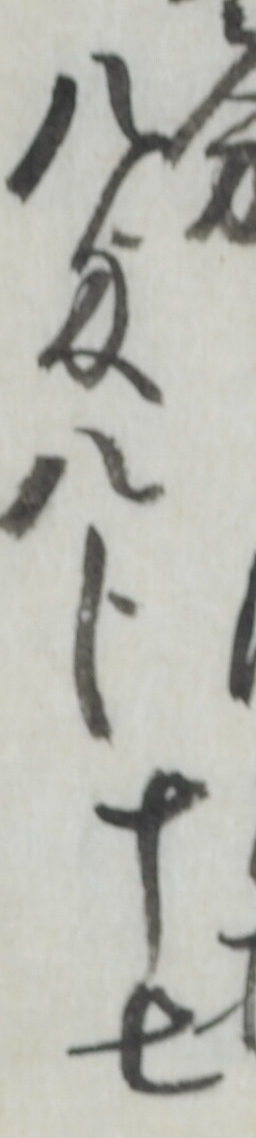八匁八分十七
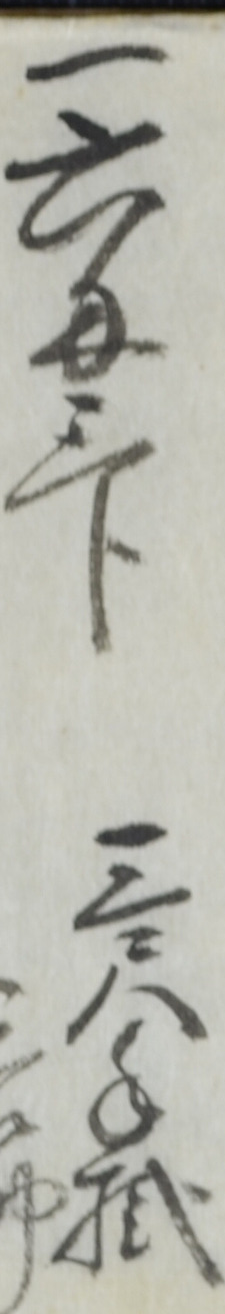一六匁三分三尺手拭
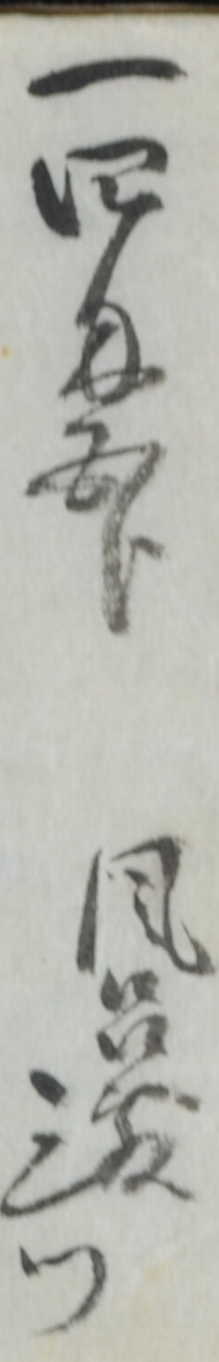一四匁五分風呂敷
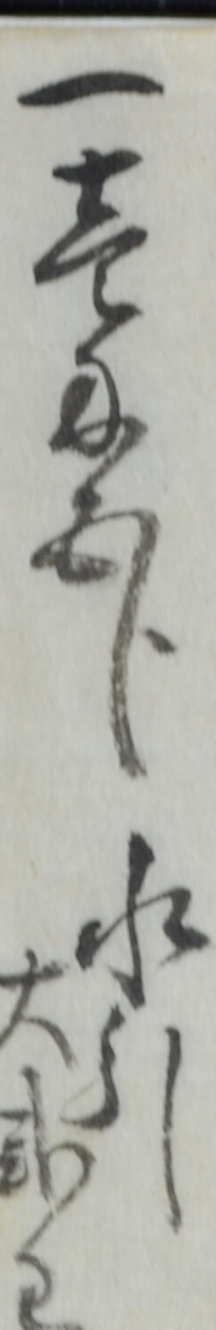一壱匁五分水引
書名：権現勧化入用勘定帳
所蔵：伊那市立高遠町図書館・合同会社AMANE
